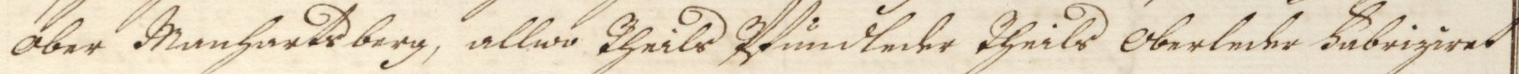Ober Manhartsberg, allwo Theils Pfundleder Theils Oberleder Fabriziret
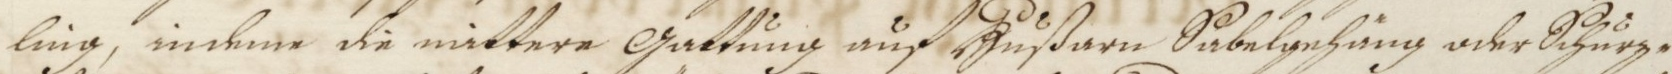ling, indeme die mittere Gattung auf Hußarn Sabelgehäng oder Schurz-
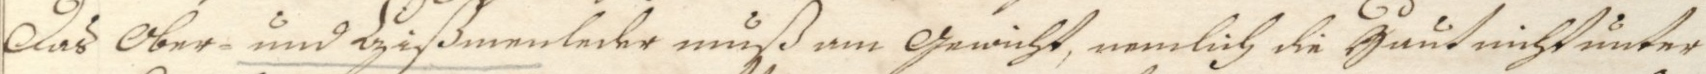Das Ober- und Czißmenleder muß am Gewicht, nemlich die Haut nicht unter
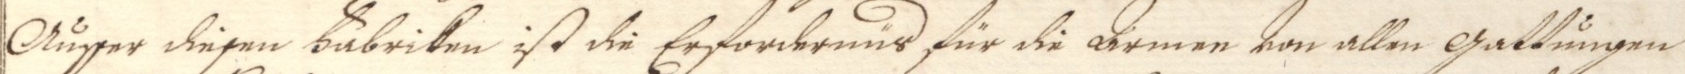Ausser diesen Fabriken ist die Erfordernüs für die Armen von allen Gattungen
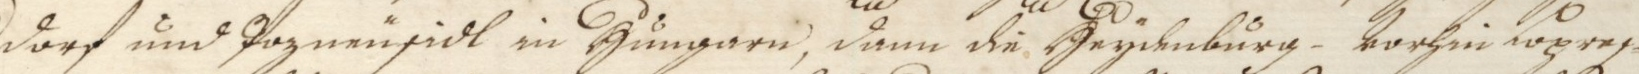dorf und Pozneüsidl in Hungarn, dann die Heydenburg - vorhin Lopres-
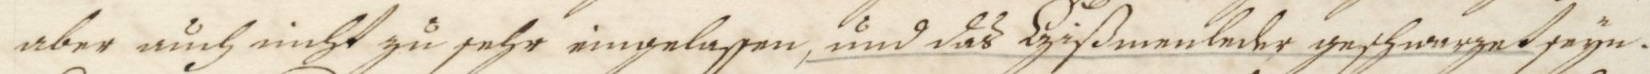aber auch nicht zu sehr eingelassen, und das Czißmenleder geschwarzet seyn.
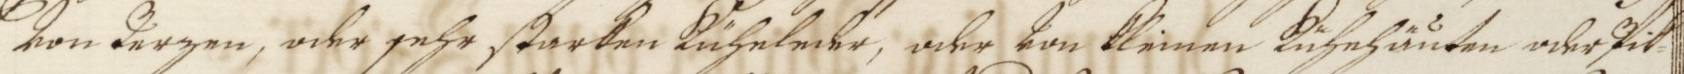von Terzen, oder sehr starken Küheleder, oder von kleinen Kühehäuten oder Pik-
